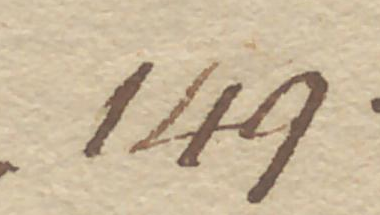149
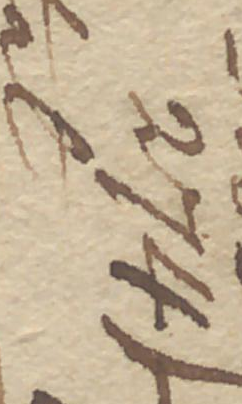274
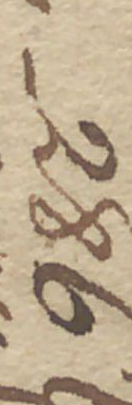286
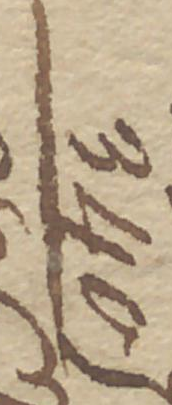340
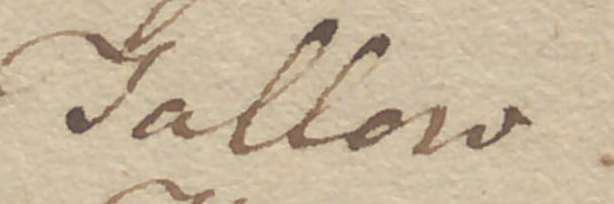Tallow
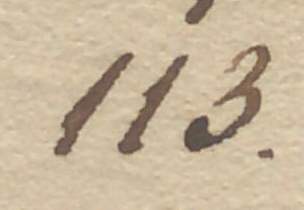113
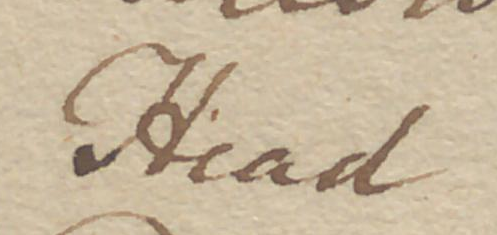Head
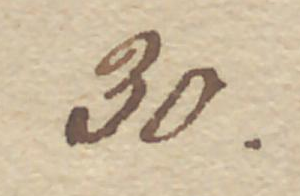30
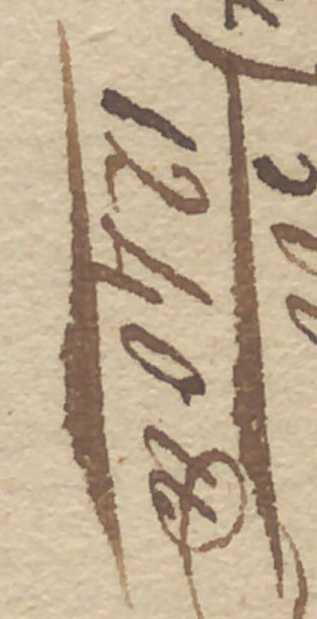1240 lb
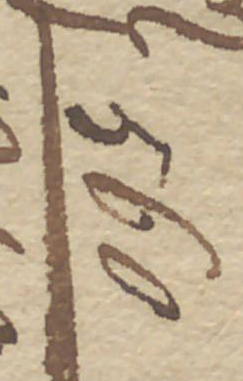560
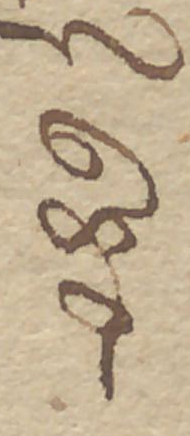680
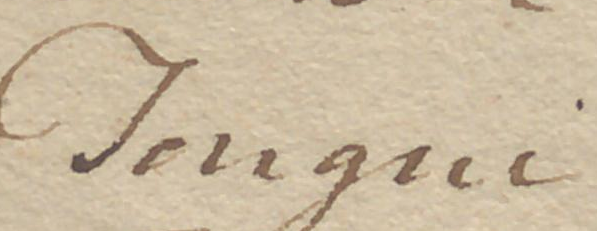Tongue
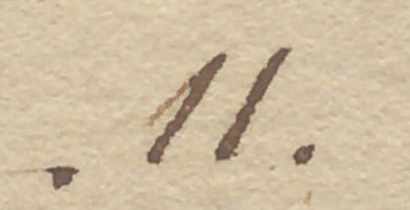11.
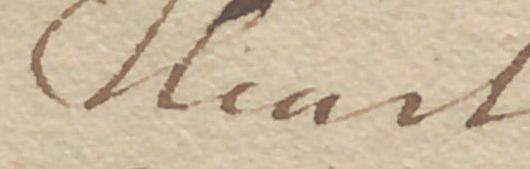Heart
